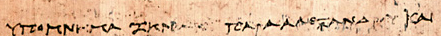υπομνημα ζην παρααλεξανδρου και
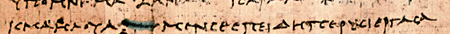ιϲμαηλουαξι μενϲεεπειδηπερυϲιεργαϲα
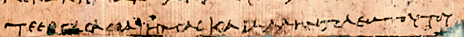τεεργαϲαϲθαιημαϲ καιαλληνπλεωτουτου
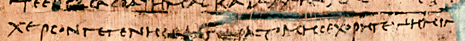χερϲονγεγενηϲθαιπαρατομηϲεχορηγεινημιν
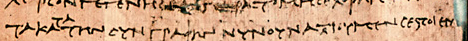τακατην ϲυν γραφην νυνουναξιουμενϲεποιεν
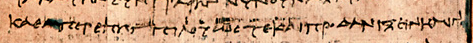καθαπερεπηγγειλουωϲτεκαιπροδανιζεινημιν
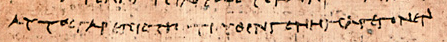αυτοϲγαρ επιϲτη τιουθενγενημαγεγονεν
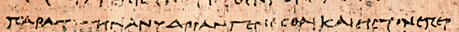παρατο τ ηνανυδριανγενεϲθαικαιειϲτονεπερ
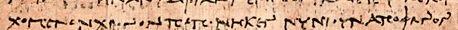χoμενονχρoνονπεπoνηκεν νυνιουναποφανον
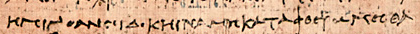ημινοανϲοιδοκηιναμηκαταφθειρωμεϲθα
